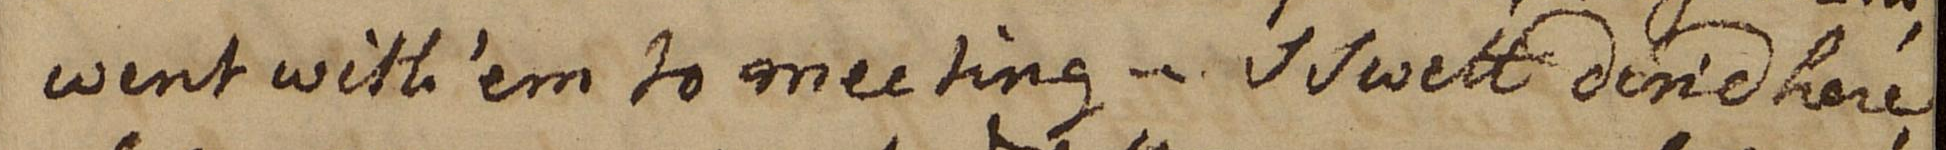went with 'em to meeting- S Swett din'd here,
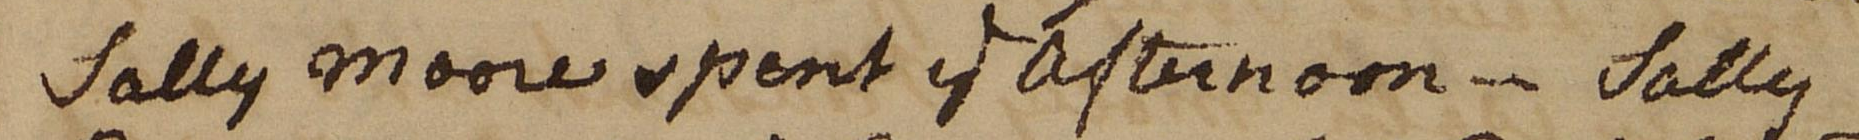Sally Moore spent y^e afternoon- Sally
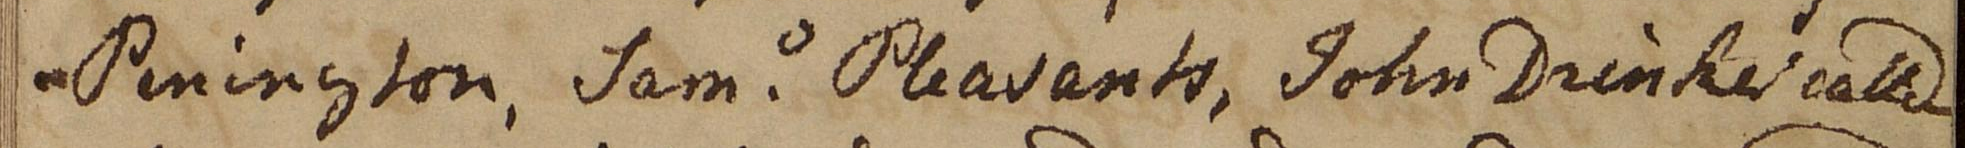-Penington, Sam^l. Pleasants, John Drinker call'd
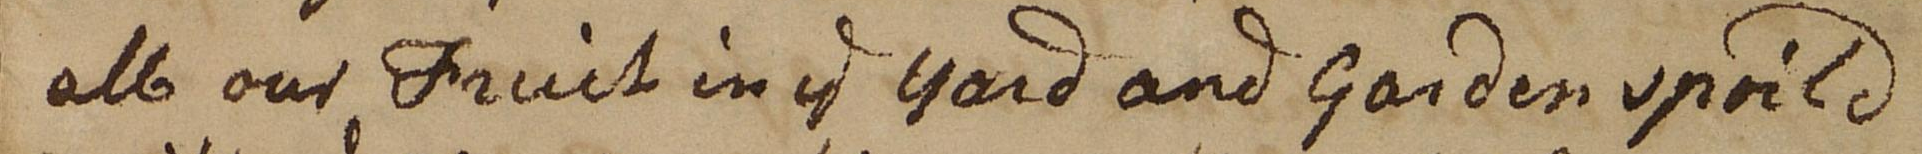all our Fruit in y^e Yard and Garden spritd
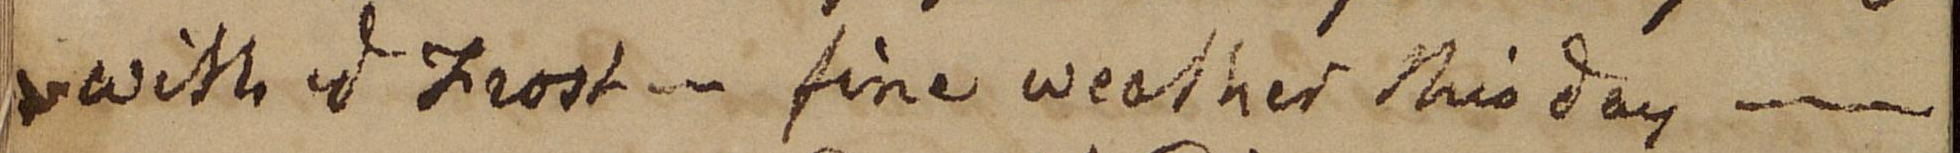with y^e Frost- fine weather this day-
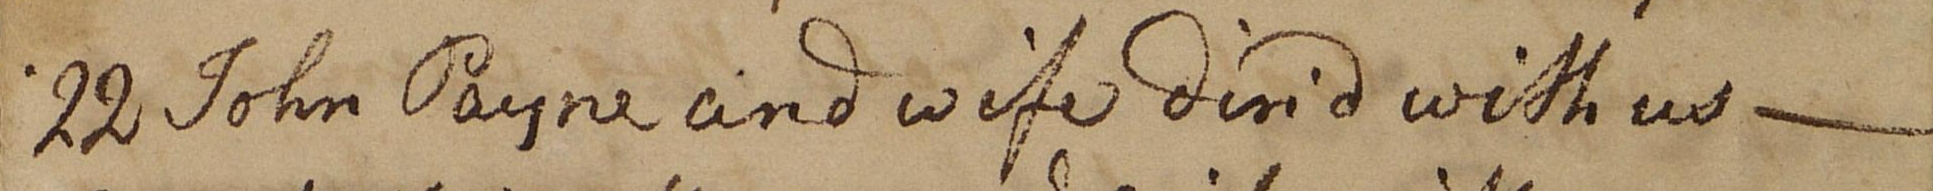22 John Payne and wife din'd with us-
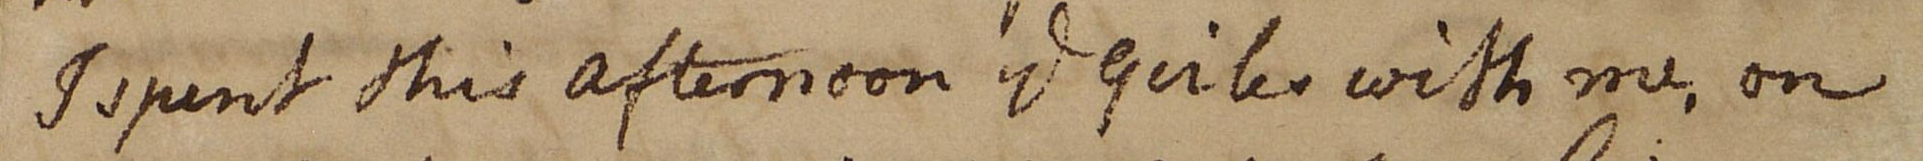I spent this afternoon y^e Girles with me, on
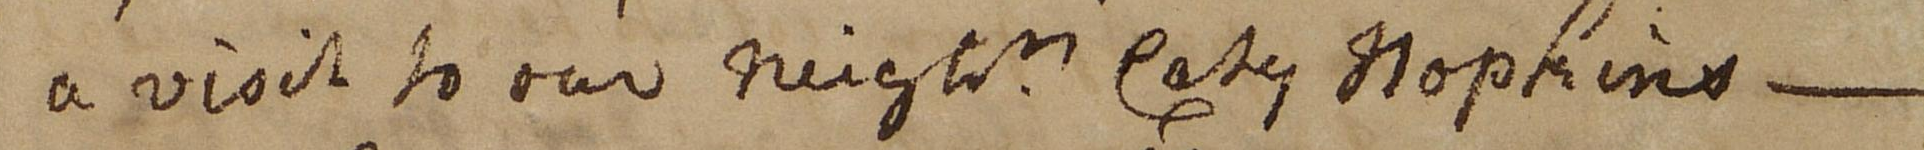a visit to our Neigh^r. Caty Hopkins-
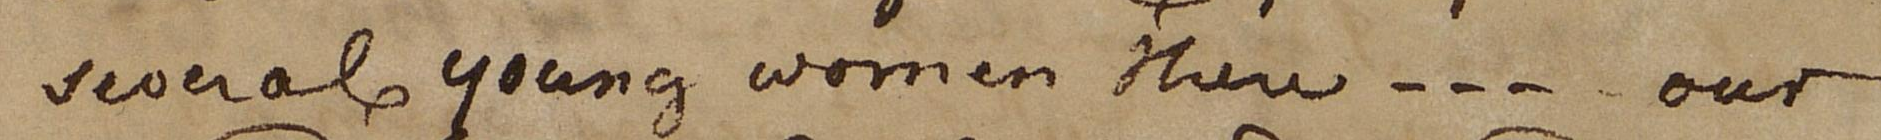several young women there---- our
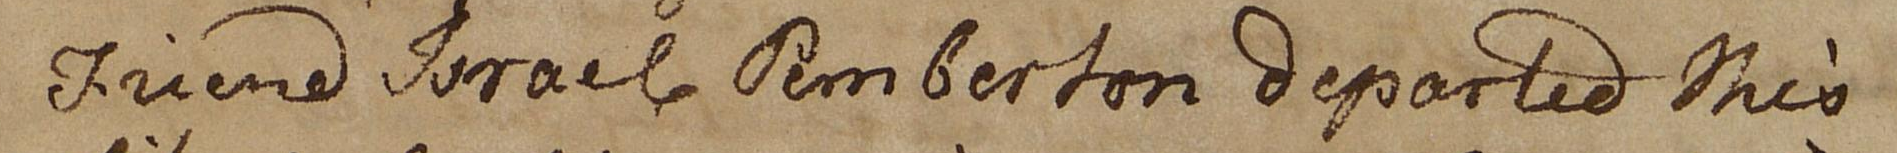Friend Israel Pemberton departed this
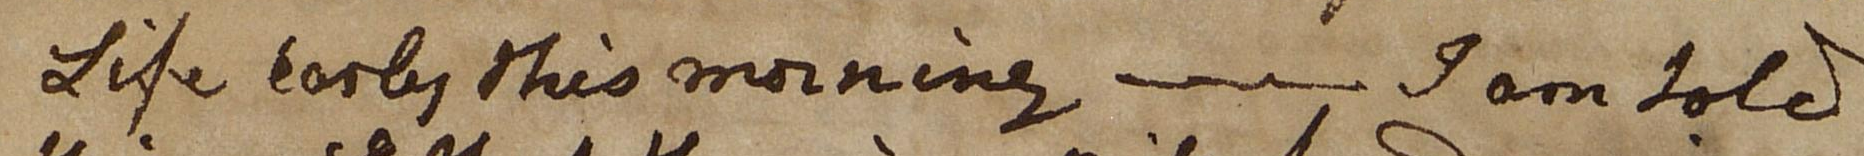Life early this morning- I am told
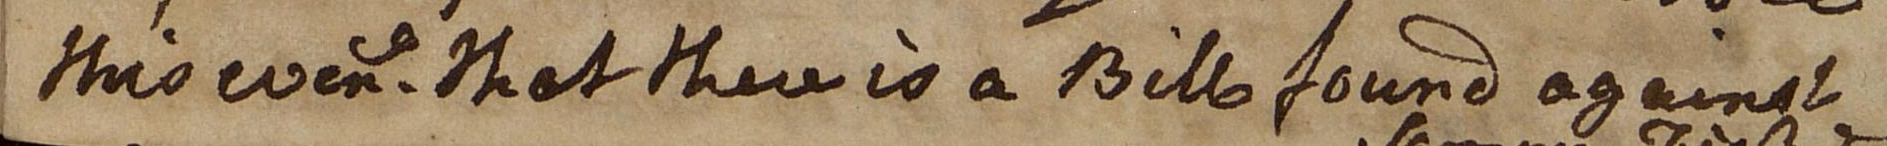this even^g. that there is a Bill found against
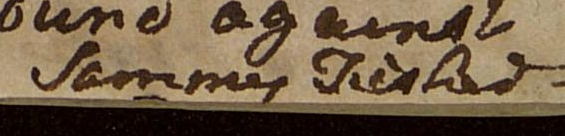Sammy Fisher
